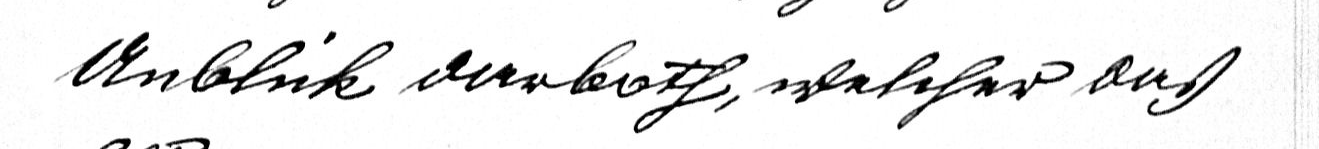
Anblick darboth, welcher das
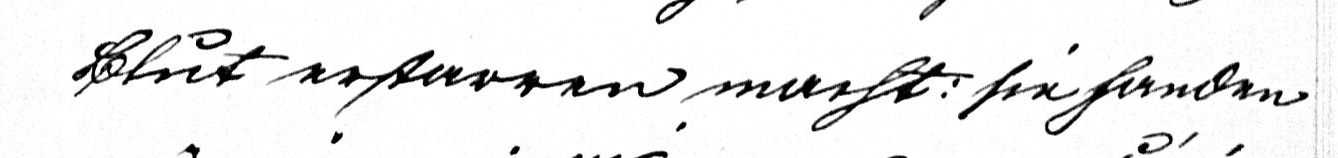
Blut erstarren macht: sie handen
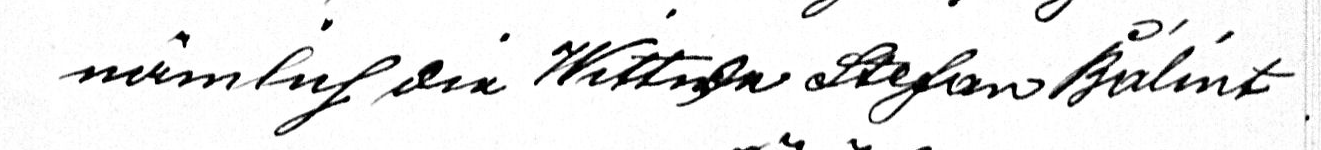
nämlich die Wittwe Stefan Bálint
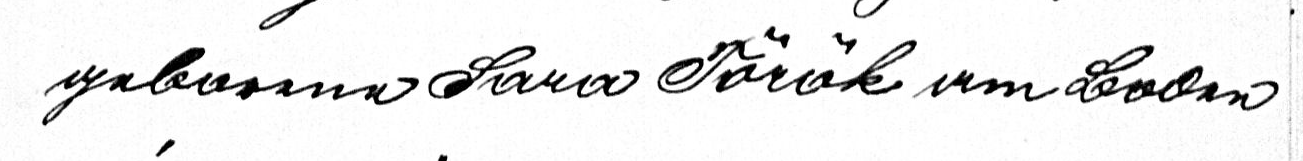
geborene Sara Török am Boden
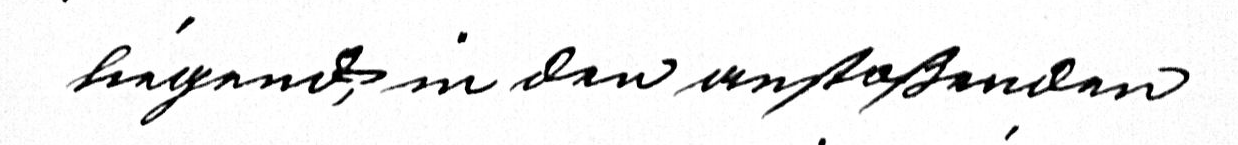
liegend, in den anstoßenden
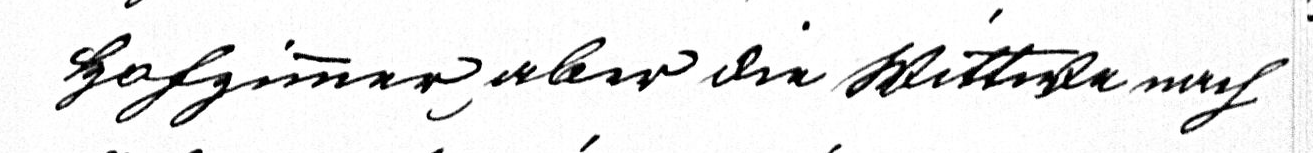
Hofzimmer aber die Wittwe nach
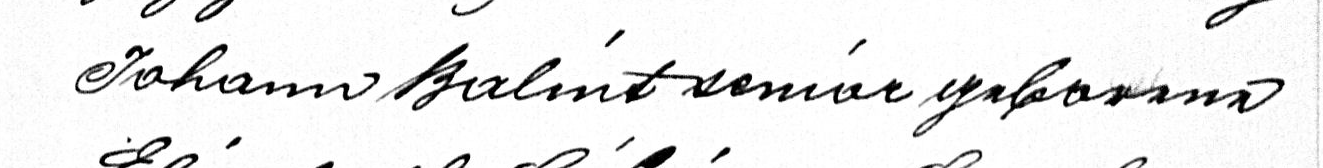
Johann Balint senior geborene
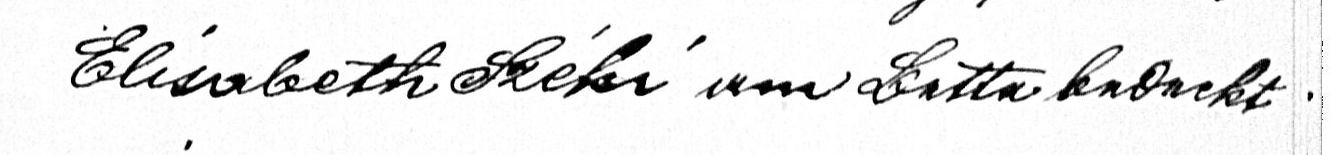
Elisabeth Széki am Bette bedeckt
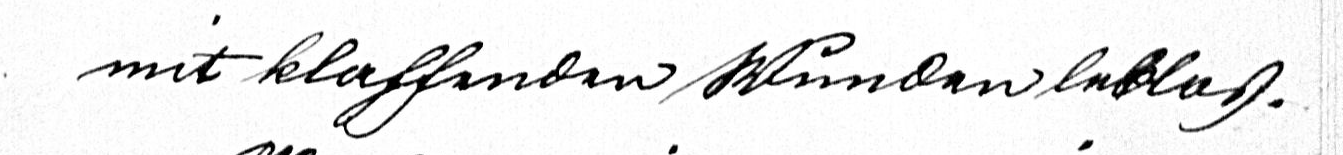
mit klaffenden Wunden leblos.
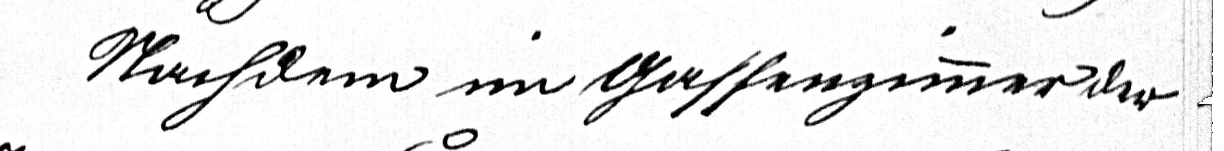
Nachdem im Gassenzimmer der
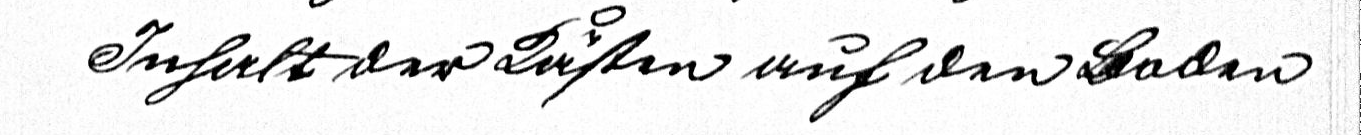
Inhalt der Kästen auf den Boden
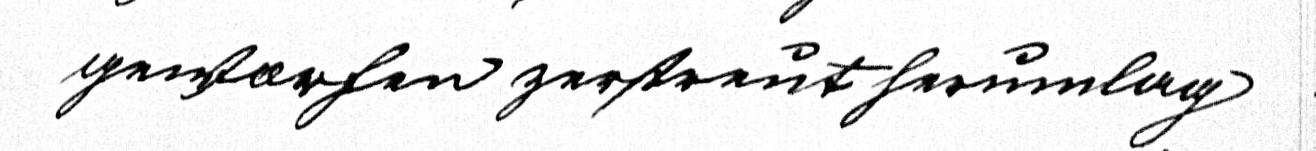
geworfen zerstreut herumlag
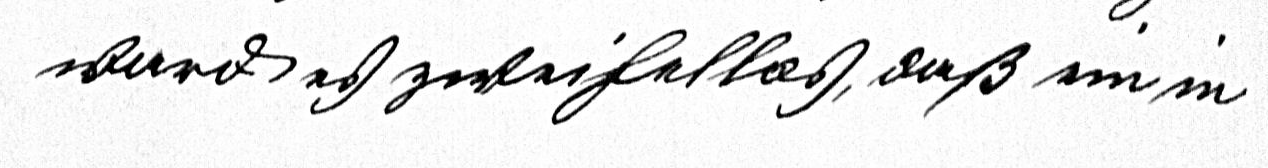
ward es zweifellos, daß ein in
